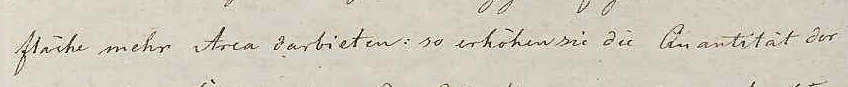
fläche mehr Area darbieten: so erhöhen sie die Quantität der
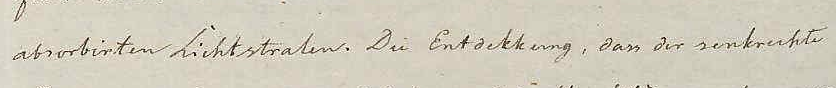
absorbirten Lichtstrahlen. Die Entdekkung, dass der senkrechte
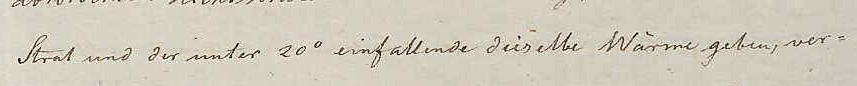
Stral und der unter 20° einfallende dieselbe Wärme geben, ver-
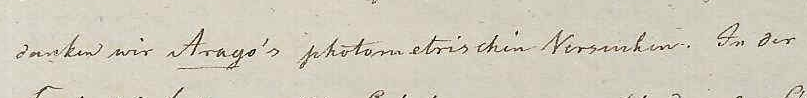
danken wir Arago's photometrischen Versuchen. In der
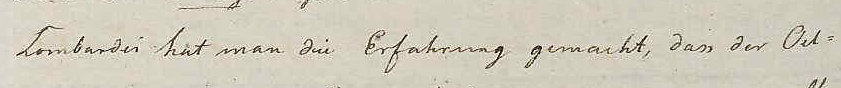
Lombardei hat man die Erfahrung gemacht, dass der Oel-
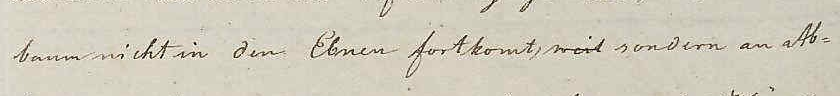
baum nicht in den Ebnen fortkomt, weilsondern an Ab-
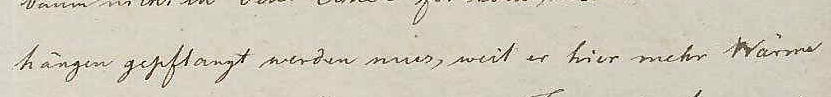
hängen gepflanzt werden mus, weil er hier mehr Wärme
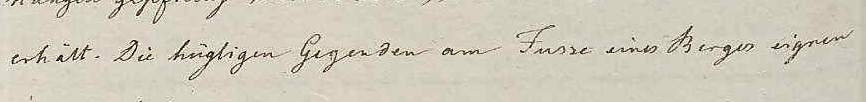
erhält. Die hügligen Gegenden am Fusse eines Berges eignen
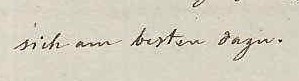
sich am besten dazu.
